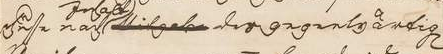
schusse nach MitgabeInhalt des gegenwärtigen
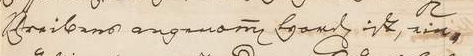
Schreibens angenommen worden ist, ein-
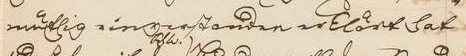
müthig einverstanden erklärt hat
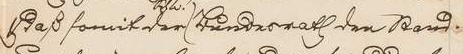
daß somit der Schw. Bundesrath den Stand-
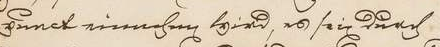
punct einnehmen wird, es seien durch
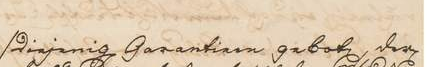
diejenigen Garantieen geboten, deren
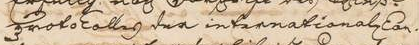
protokolles der internationalen Con-
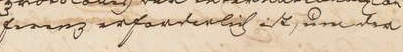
ferenz erforderlich ist, um der
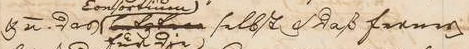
& n. das letztereConsortium selbst & daß ferner
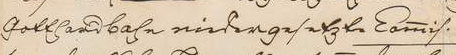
Gotthardbahn niedergesetzte Commis-
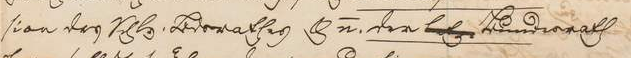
sion des Schw. Bdsrathes & n. der letztereBundesrath
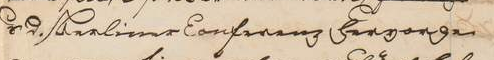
aus d. Berliner Conferenz hervorge-
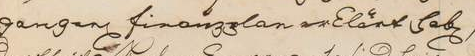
gangenen Finanzplan erklärt haben,
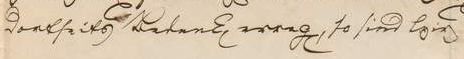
dortseits Bedenken erregen, so sind wir
